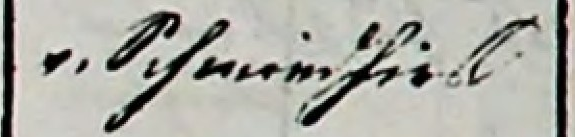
v. Schmiedhies
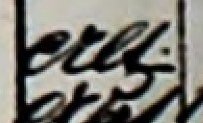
Alt
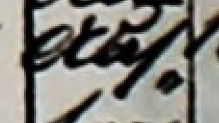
Aus„
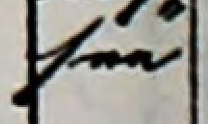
see
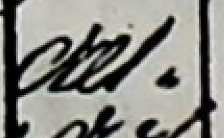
Alt„
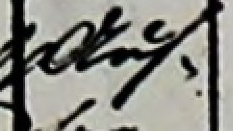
Aus„
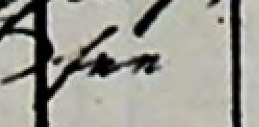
see
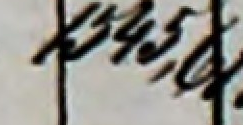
1545,6
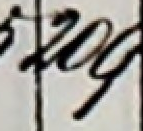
209
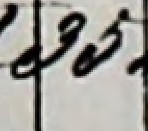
35
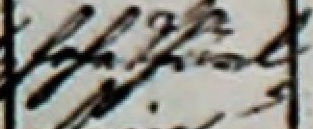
hohe Pfürl„
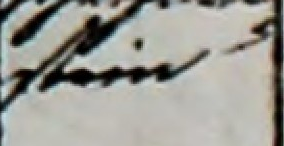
stein
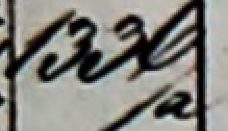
1336/a
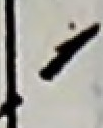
1
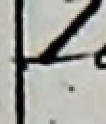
I
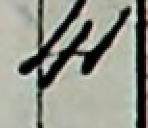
41
